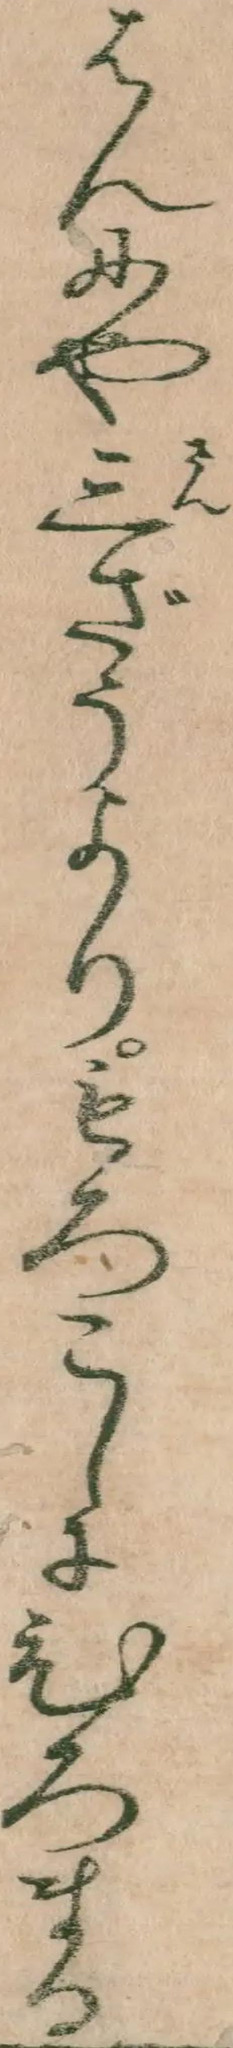はんにや三ざうより。もろこしにひろまる
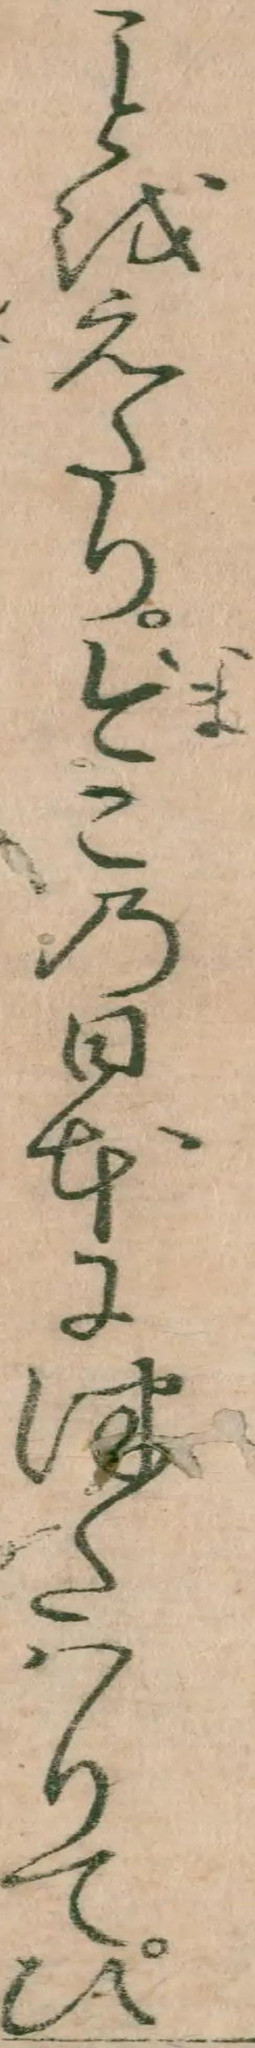ことをえたり。今この日本につたはりて。ひ
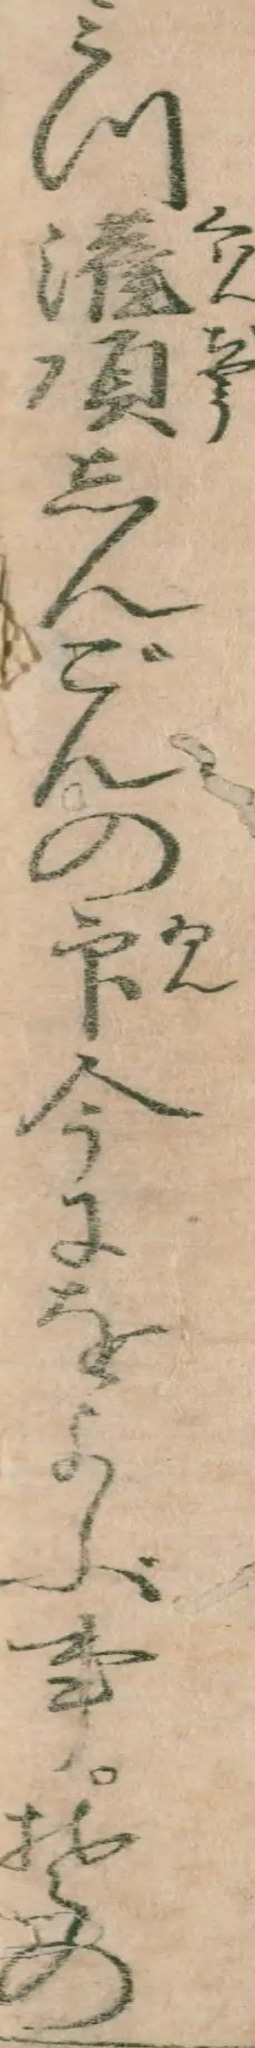みつ灌頂しんごんの印今にをよぶ事。その
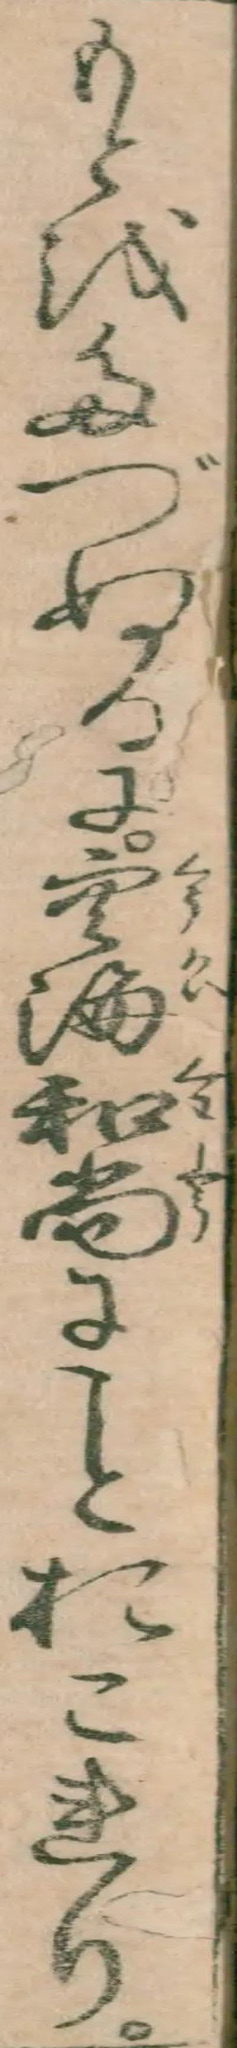もとをたづぬるに。空海和尚にことおこれり。
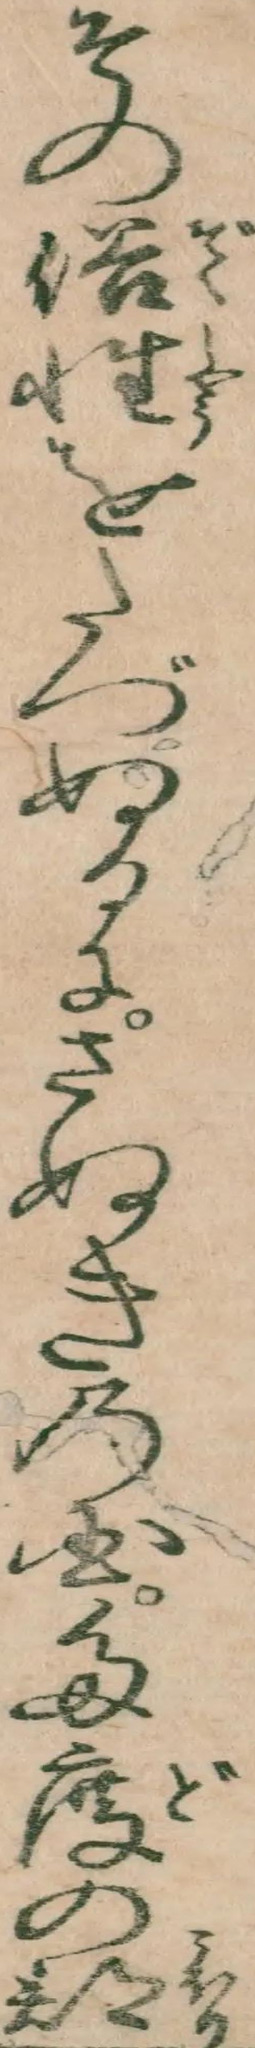その俗性をたづぬるに。さぬきの国。多度の郡
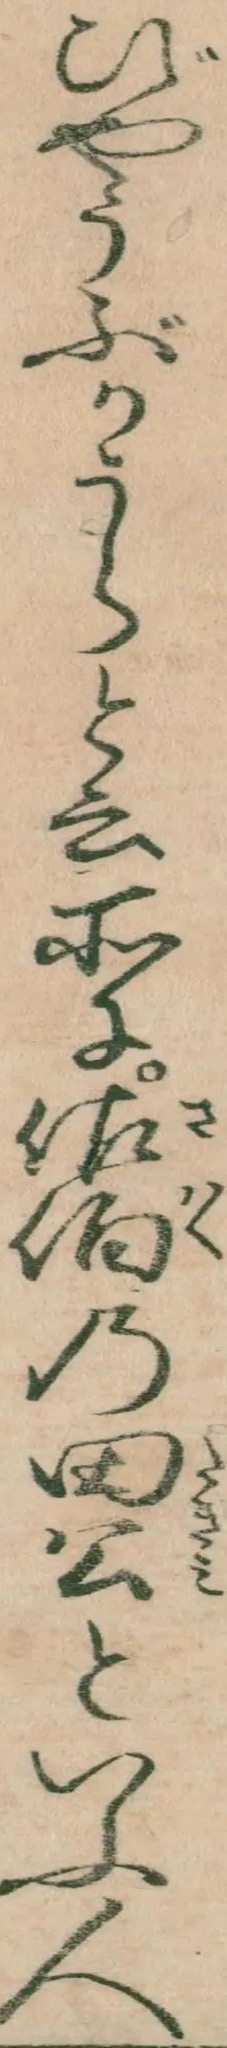びやうぶかうらと云所に。佐伯の田公といふ人
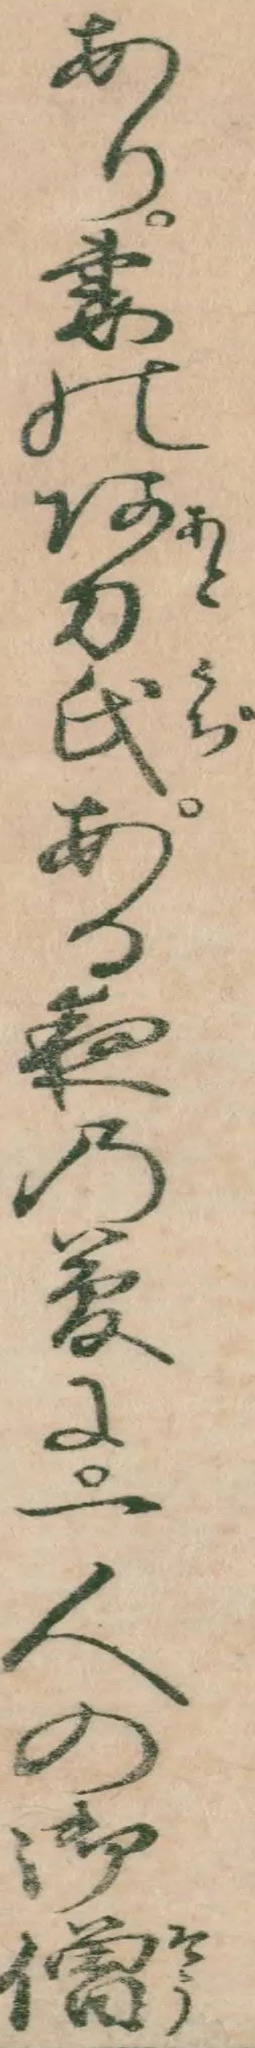あり。妻の阿刀氏。ある夜の夢に。一人の御僧
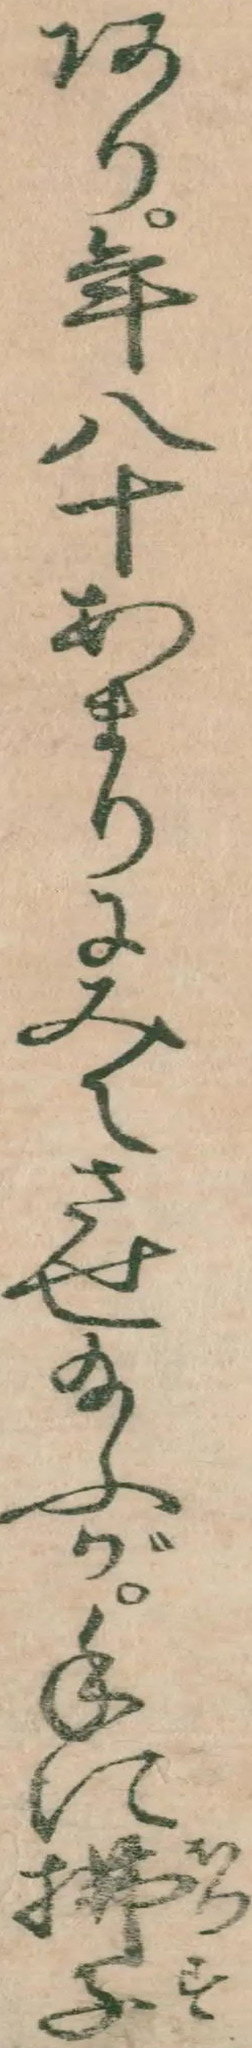あり。年八十あまりにみえさせ給ふが。手に払子
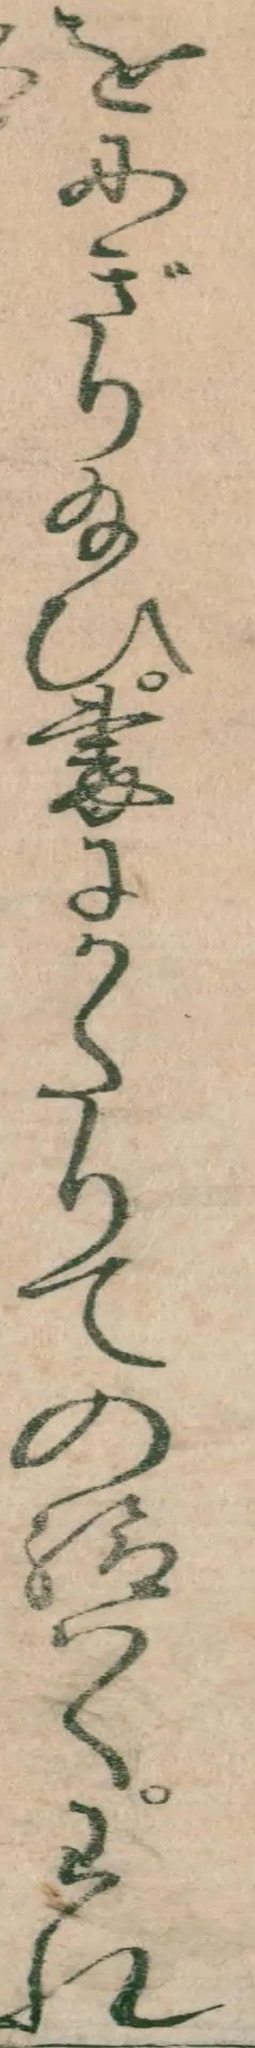をにぎり給ひ。妻にかたりての給はく。われ
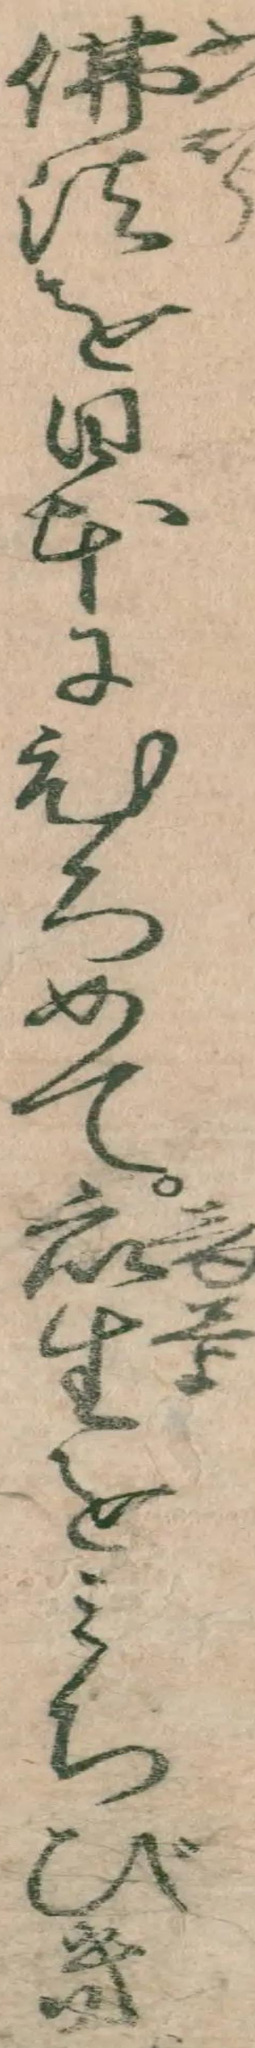仏法を日本にひろめて。衆生をみちびき
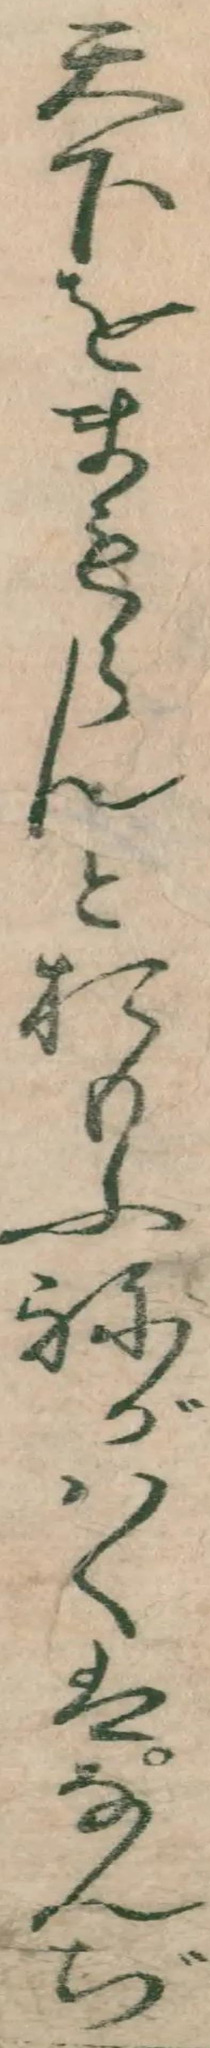天下をまもらんとおもふねがはくは。なんぢ
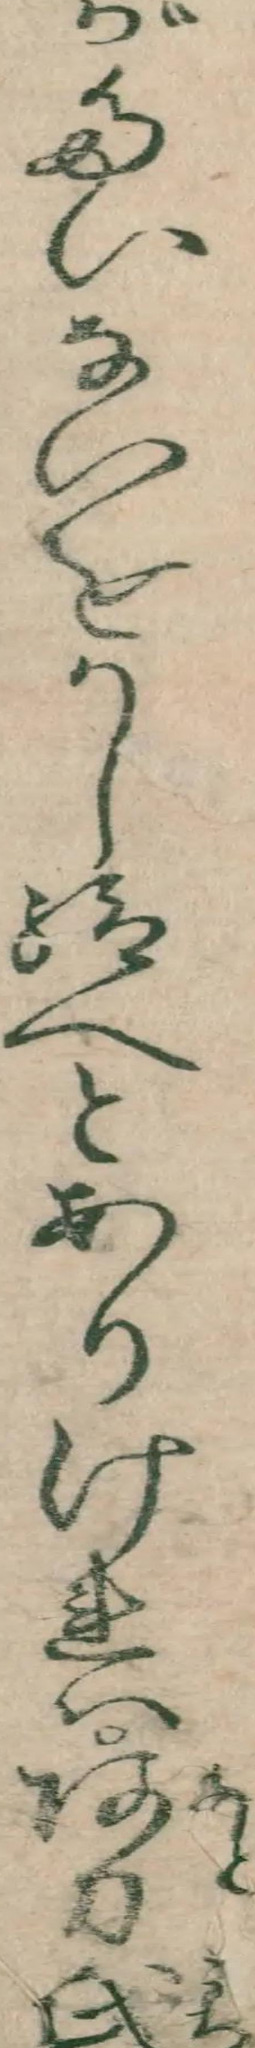がたいないをかし給へとありけれは。阿刀氏

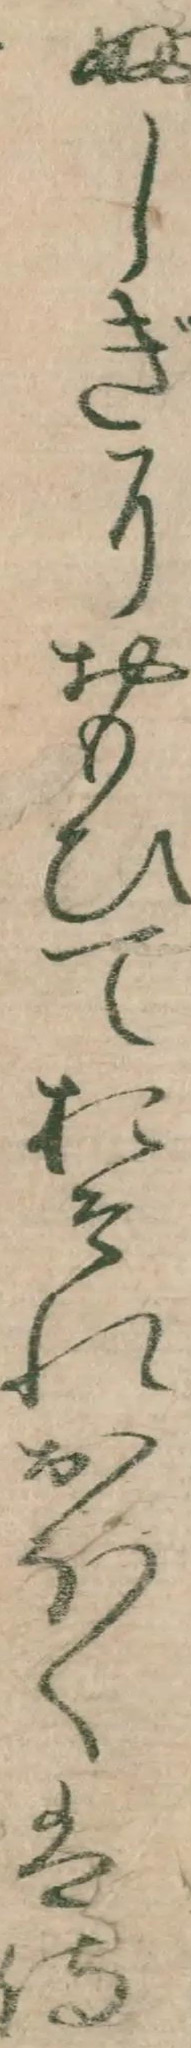ふしぎにおもひておそれおほくは侍
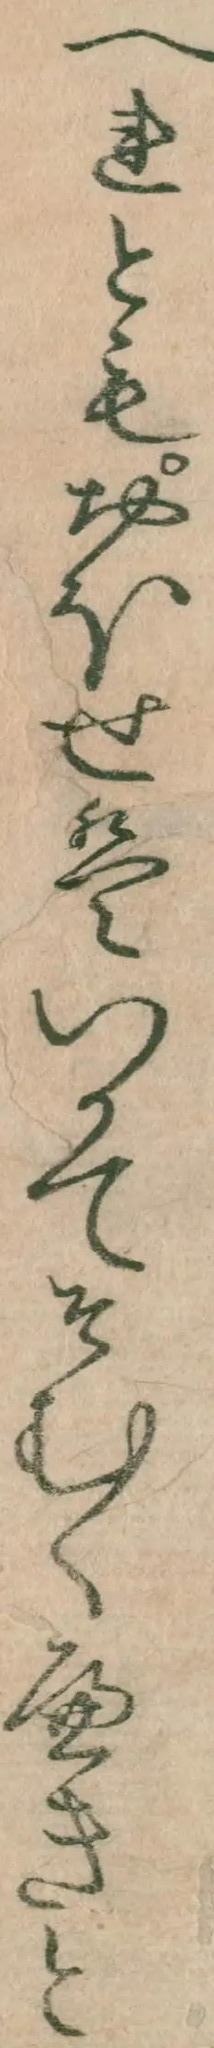へれとも。おほせはいかてそむくへきと
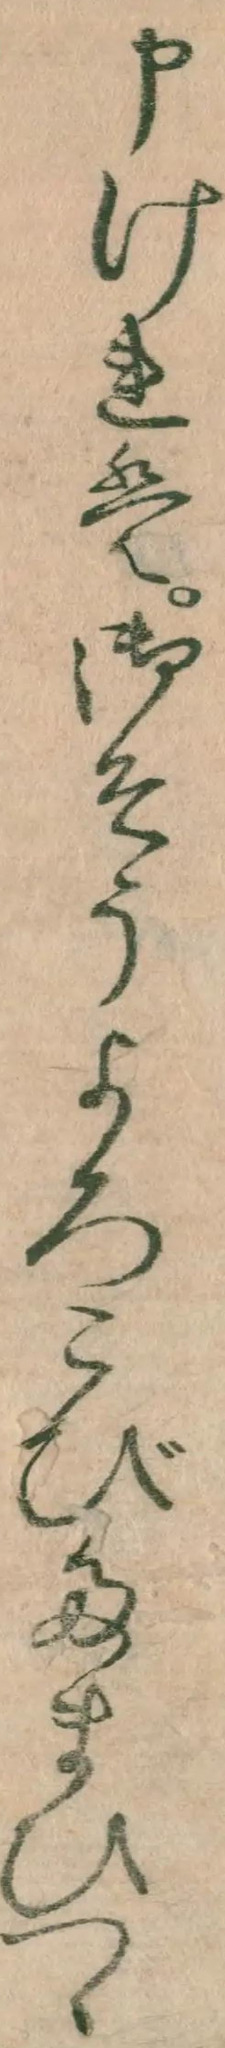申けれは。御そうよろこびたまひつゝ
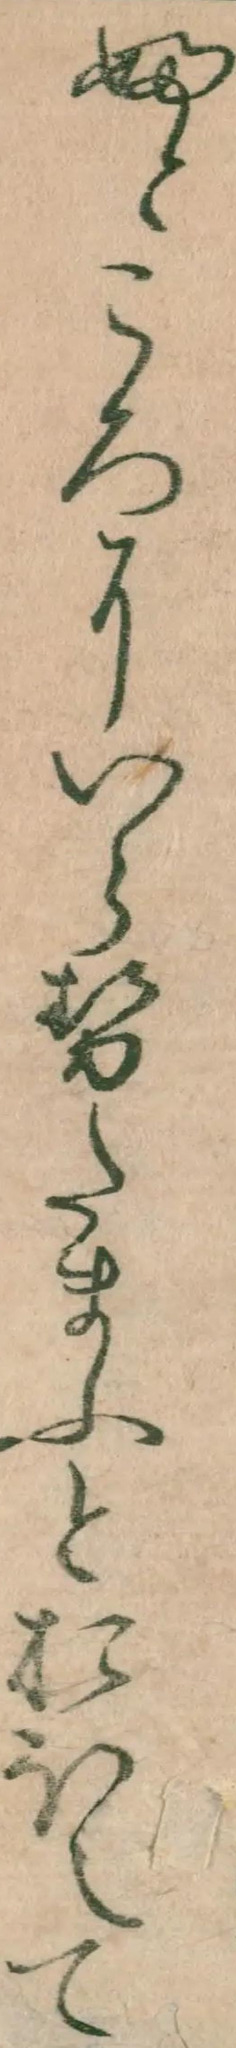ふところにいらせたまふとおほえて
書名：弘法大師御本地 3巻. [1]
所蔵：国立国会図書館 National Diet Library, JAPAN
